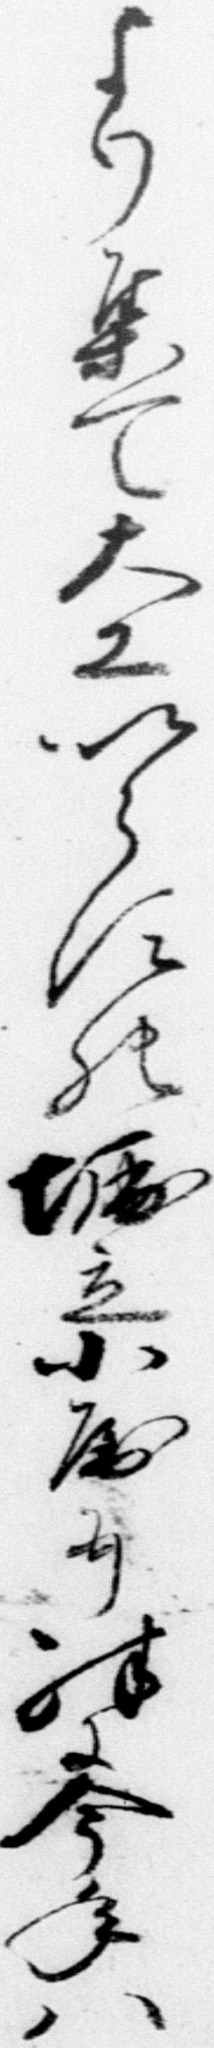より集て大工いらすの堀立小屋に殊に今年は
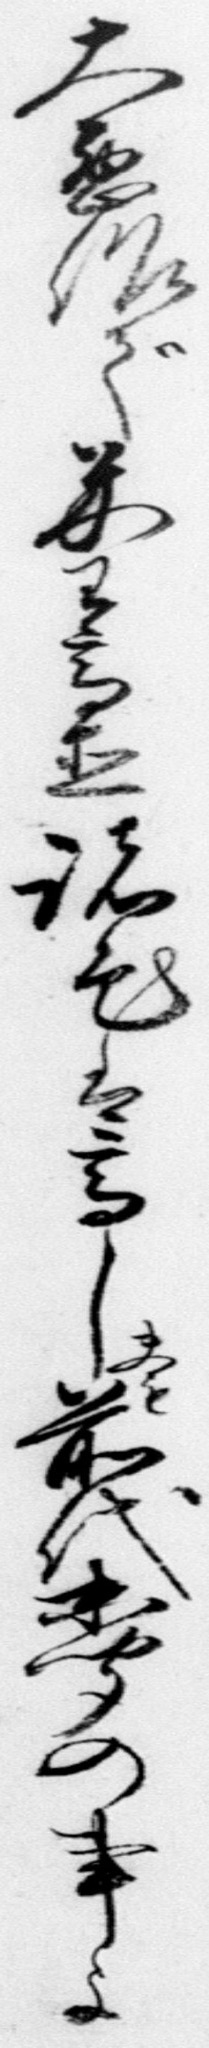大悪作で米わ高直諸色は高し夫も前代未聞の事よ
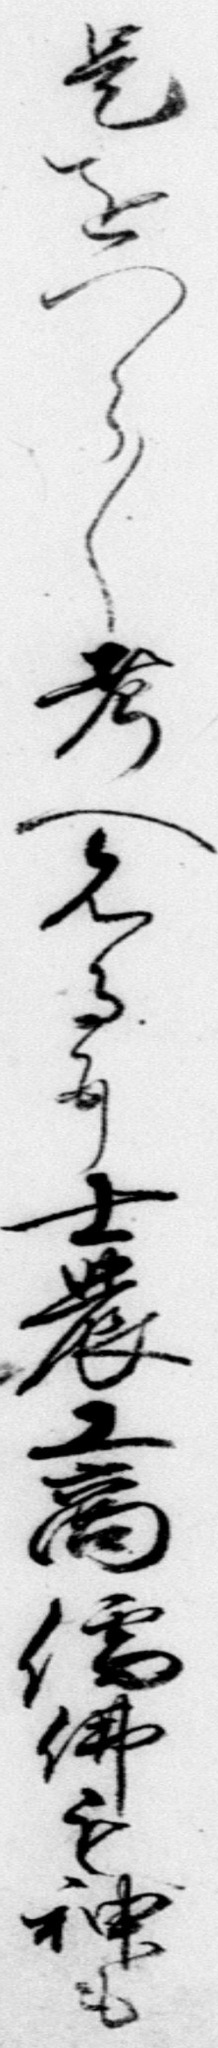是をつら〳〵考へ見るに士農工商儒仏も神も
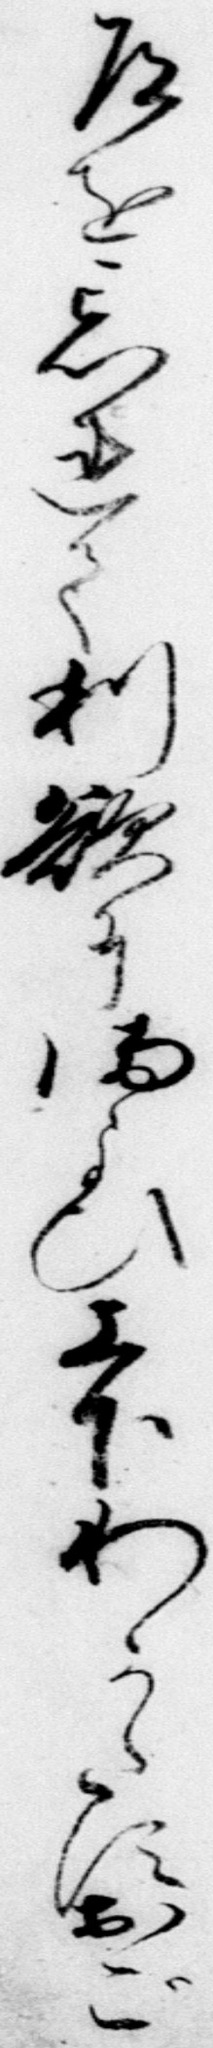道を忘れて利欲にまよひ上下わかたすおご

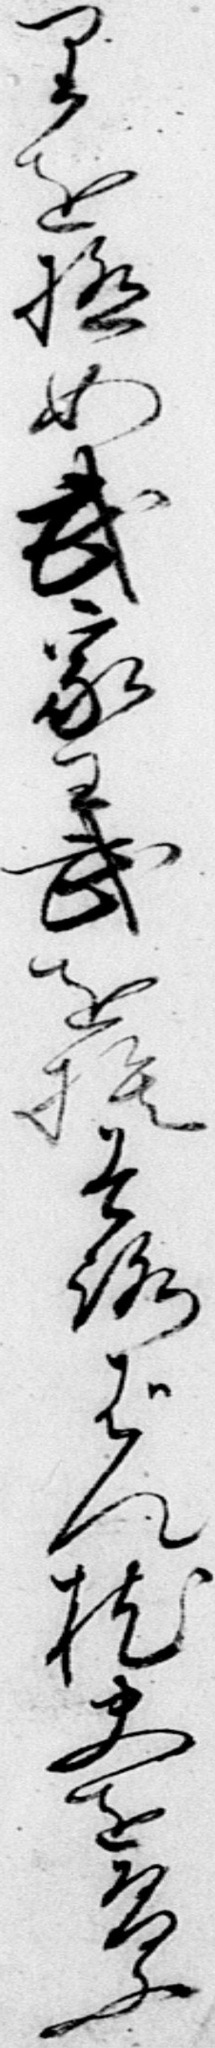りを極め武家わ武を捨そろばん枕夫を習ふ
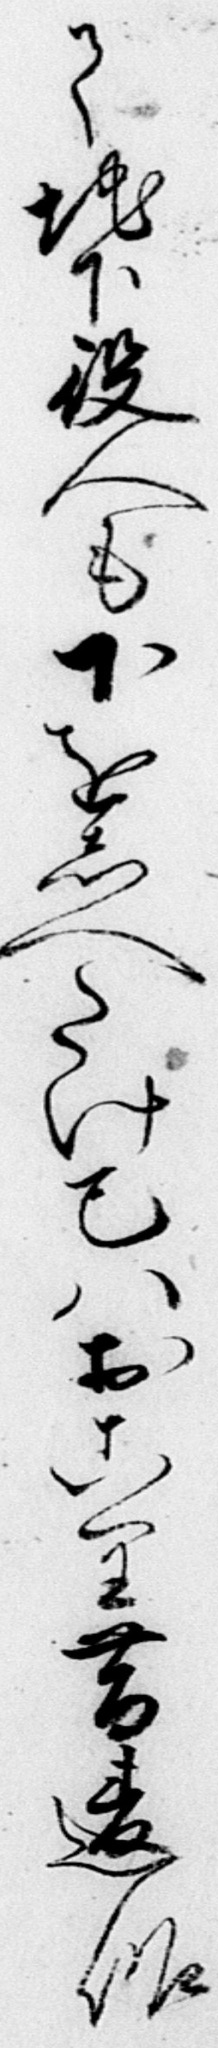て城下役人も下をしへたけ己はおこり昔違作
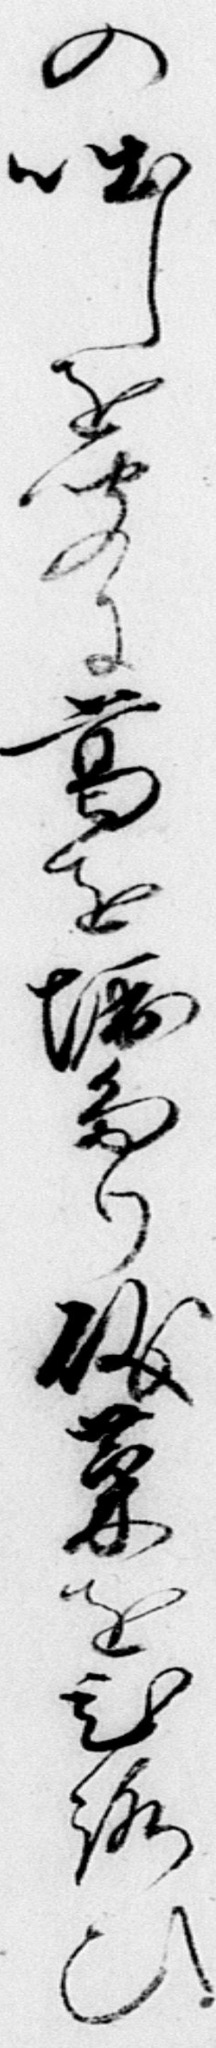の咄しを聞に葛を掘たり磯菜をひろひ
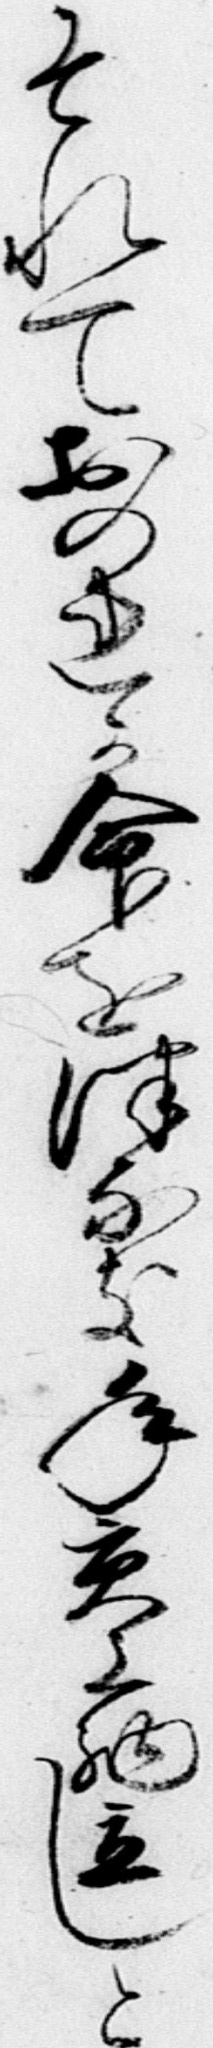それておのれか命をつなき年貢上納立しと
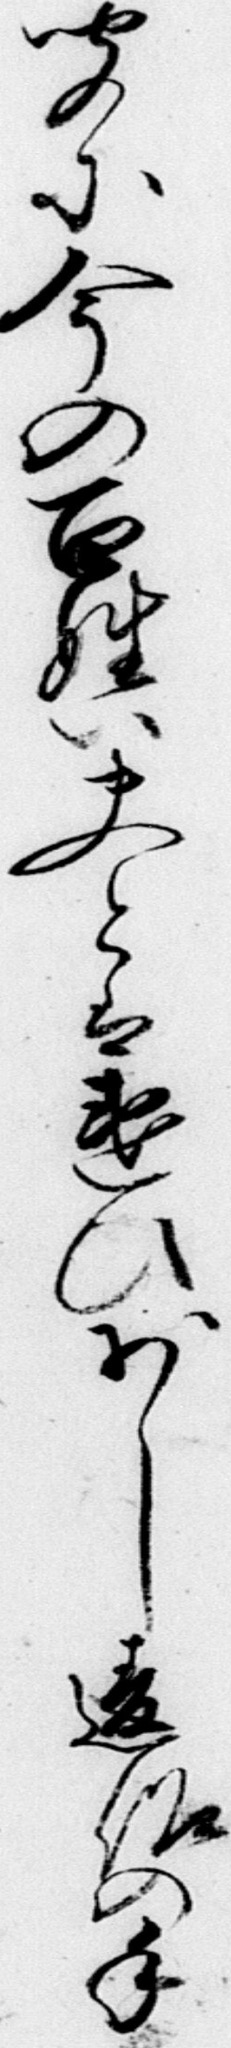聞に今の百姓は夫とは違ひ少し違作の手
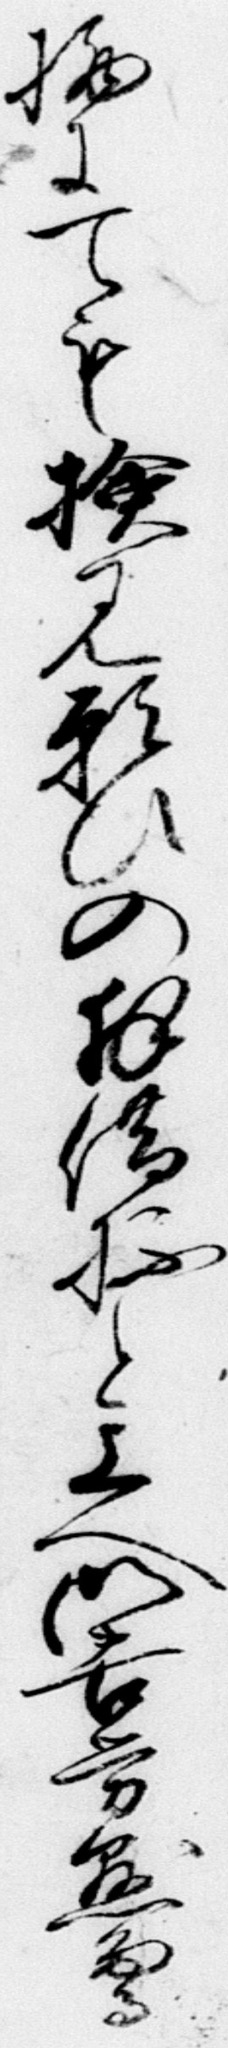柄にても検見願ひの拝借抔と上へ御苦労懸たる
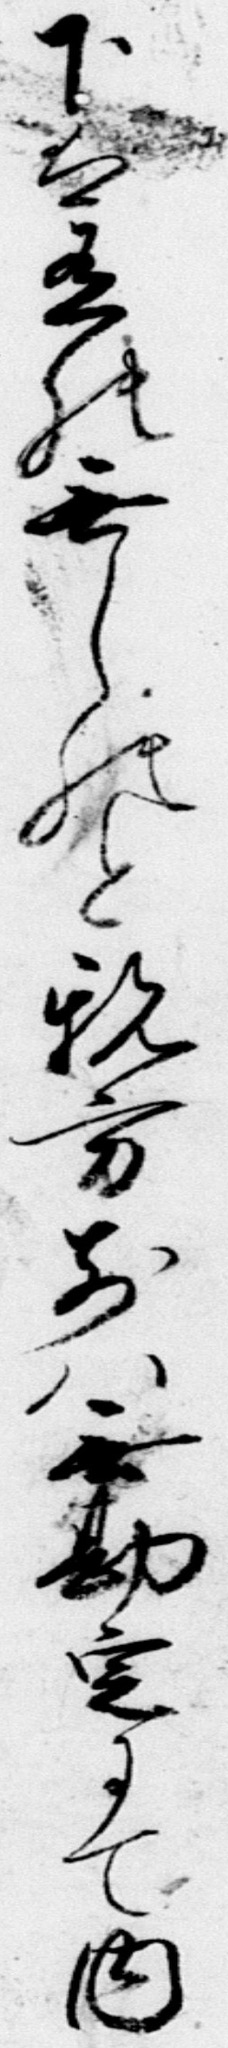下は有の無しのと親方前は無勘定にて内
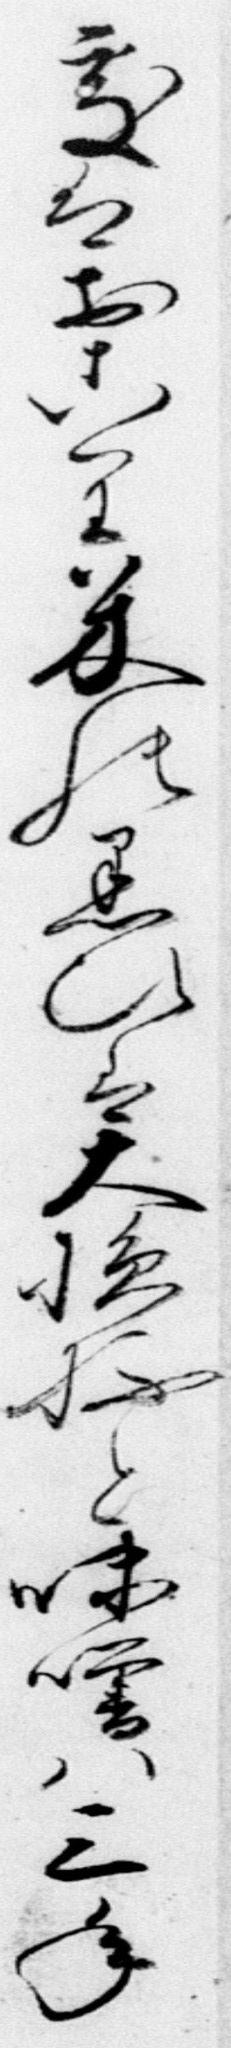処はおこり米の黒ひは大損抔と味噌は三年
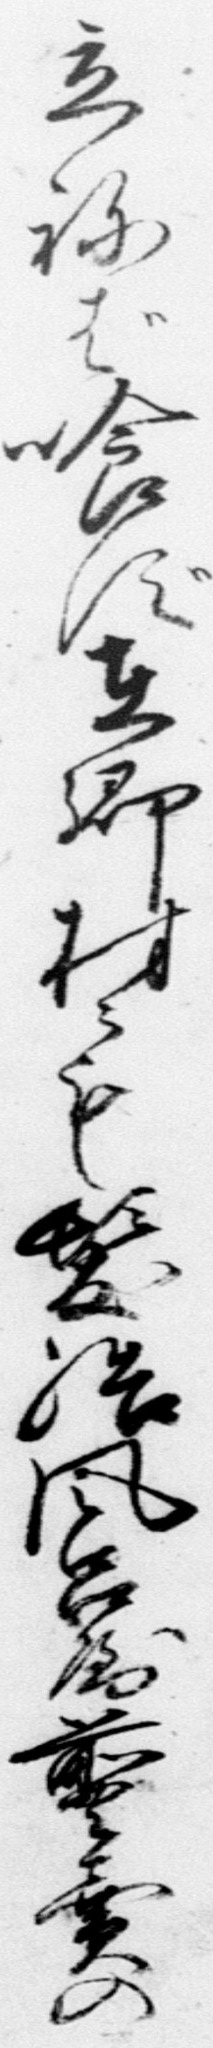立ねば喰ず在郷村々も髪結風呂屋煎売の
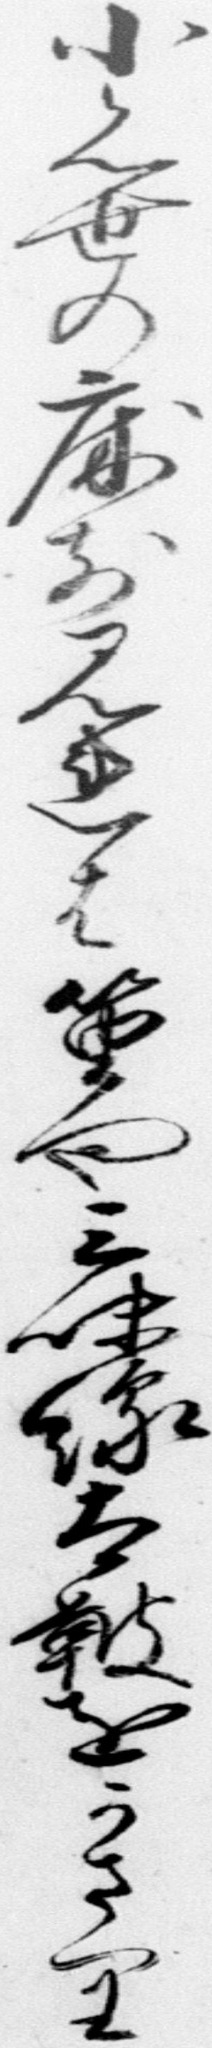小見世の床前見れは笛や三味線太鼓をかさり
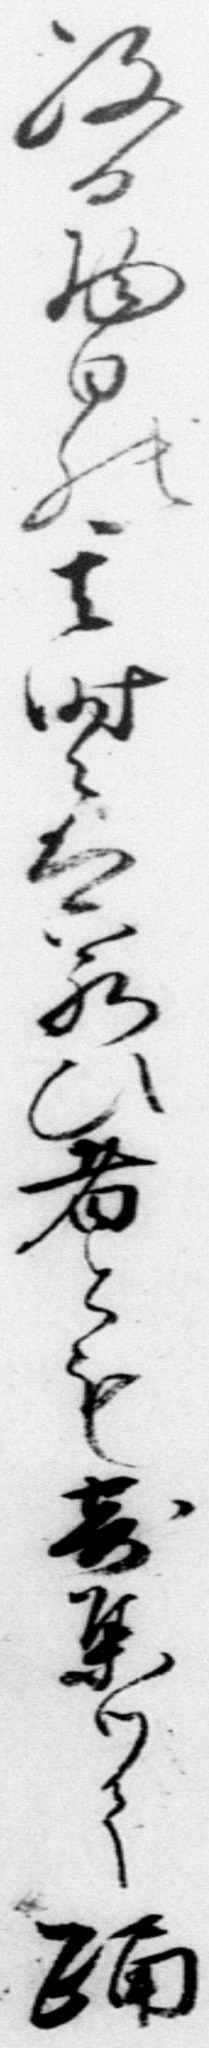役日物日の其時には若ひ者とも寄集つて踊
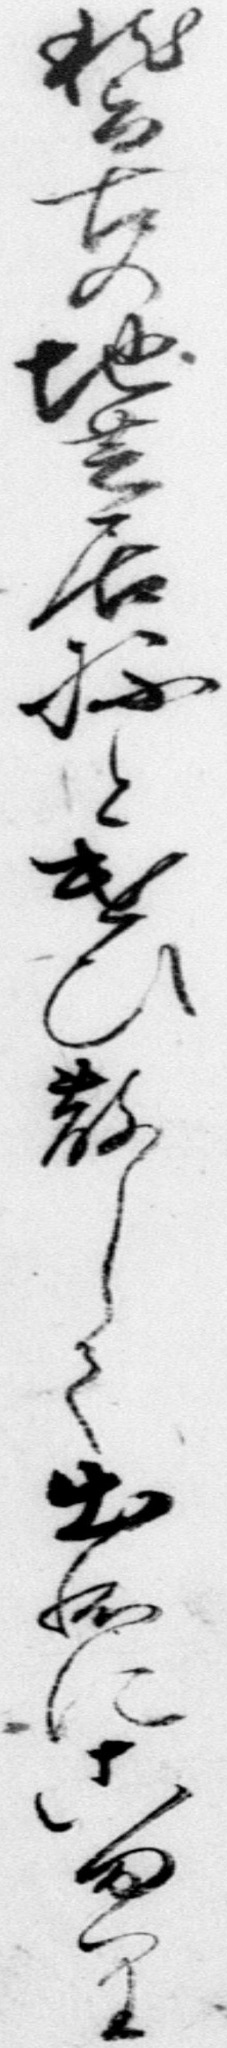稽古の地芝居抔と遣ひ散して出所にこまり
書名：越後地震由来
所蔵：徳島県立図書館
